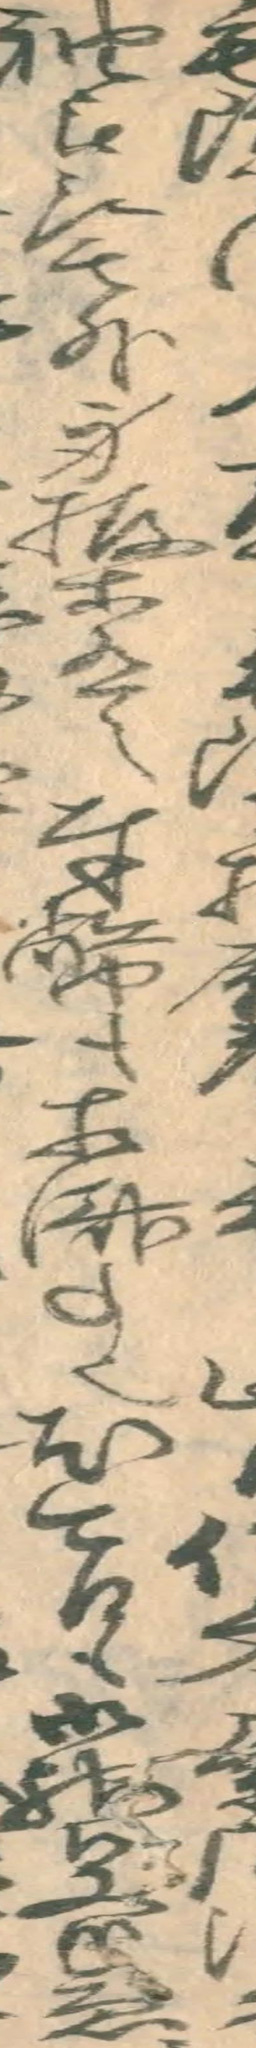袖被取其外身拵等有之奉幣も相済事也尤今日も御神事御急ニ
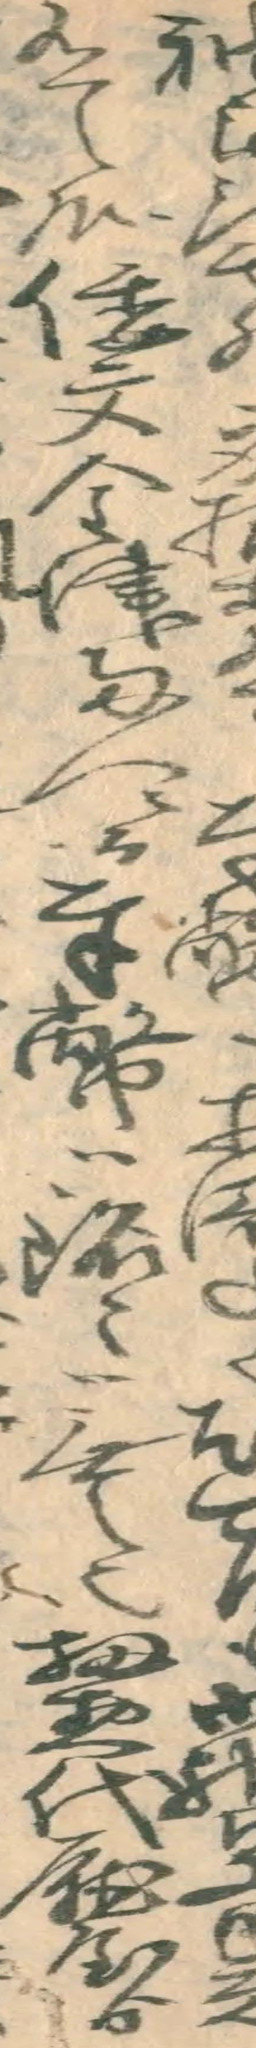有之故倭文金津両人ニ而奉幣ハ銘々ハ無之也扨惣代庁屋ゟ
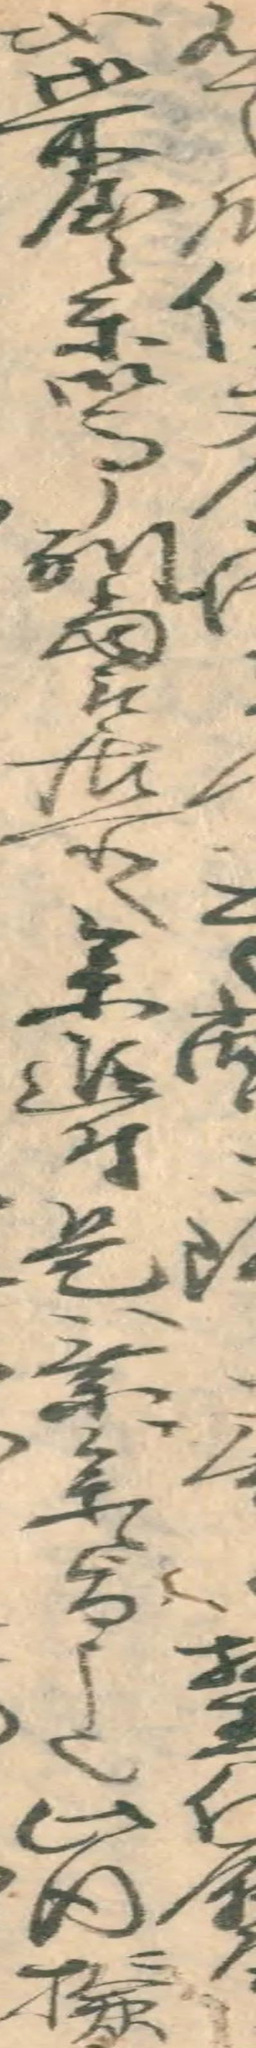出御所屋之東御馬ノ別当被居所へ参追付是へ乗参候旨申也此内ニ検
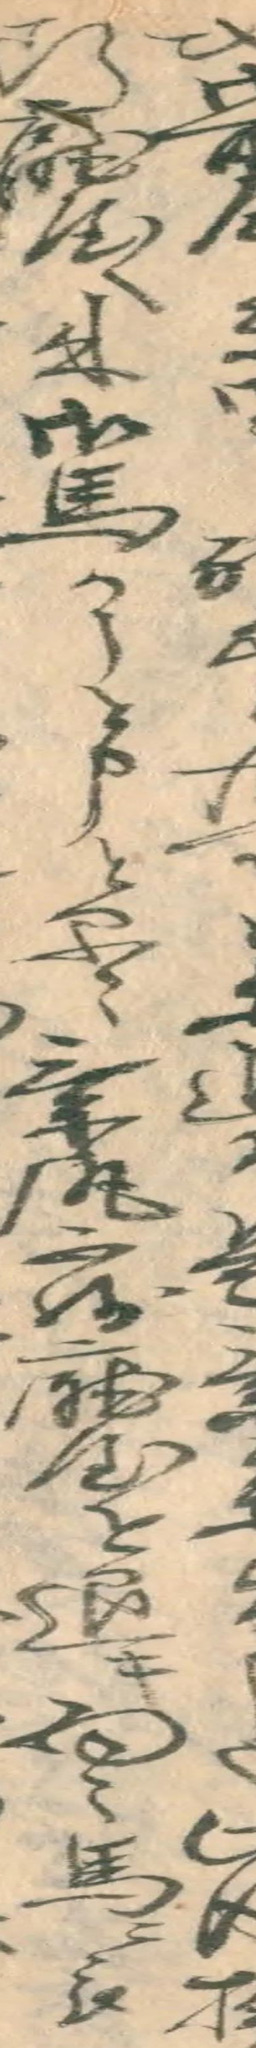断庁屋へ来御馬からと申と早々乗尻不残庁屋を退キ面々馬ニ被
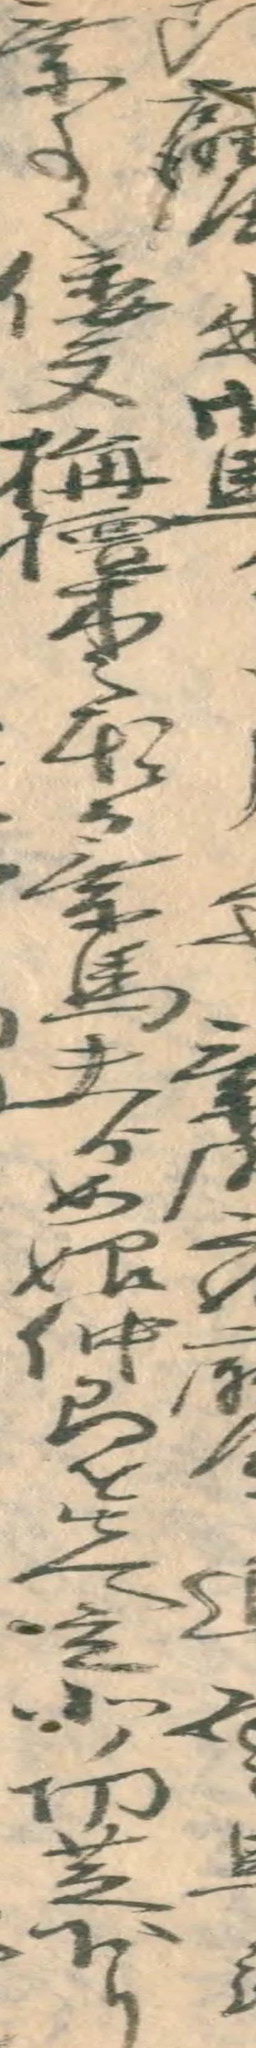乗事也倭文栴檀木之本ニ而乗馬夫ゟ如始仲間を先へ立北ノ切芝へ下り
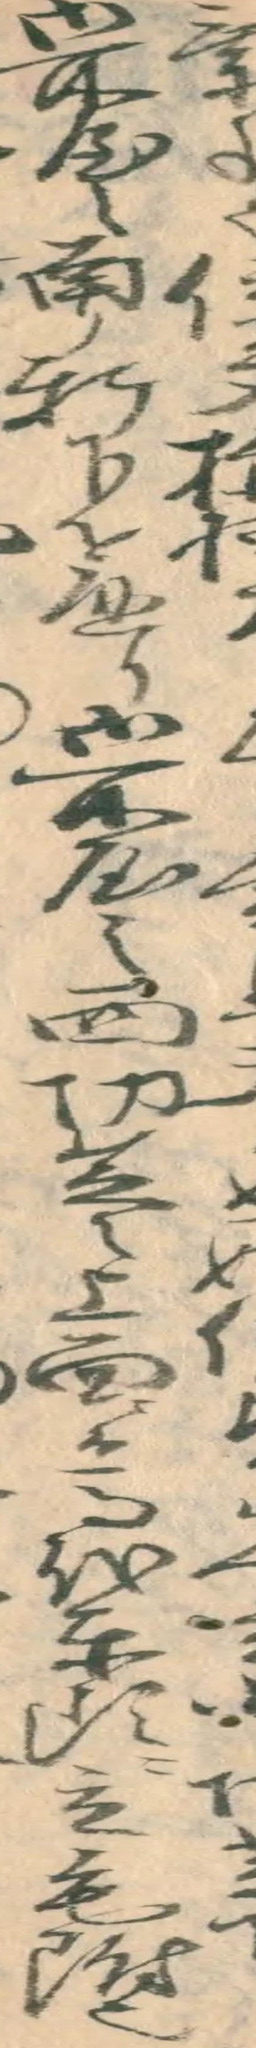御所屋之南ノ軒下を通り御所屋之西切笠之上面ニ而馬を東頭ニ立毛付也
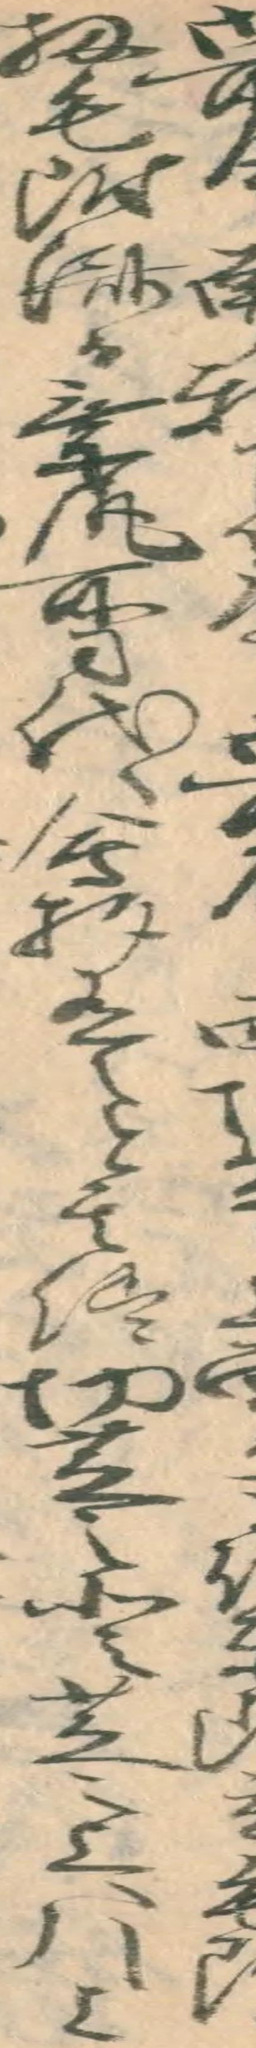扨毛付済而乗尻所司代へ会拶有之と其侭切芝之北之芝之上へ引上
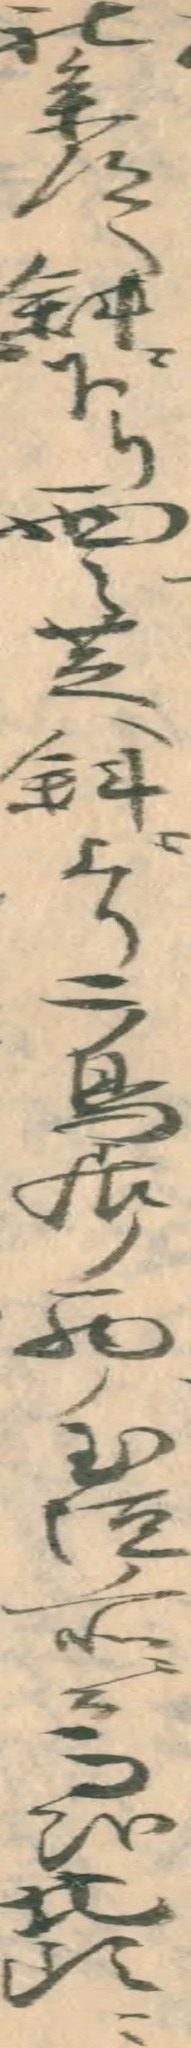社参道へ斜ニ下り西之芝へ斜ニ上り二ノ鳥居ノ西ノ玉垣ノ所ニ而馬を北頭ニ
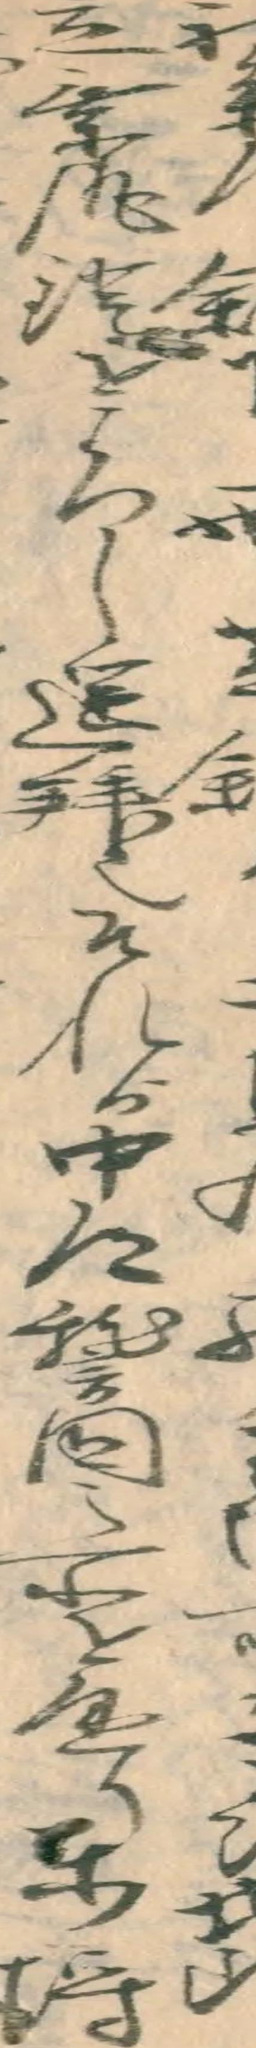立乗尻鐙をはつし遥拝也それゟ中道警固之所を通り東埒
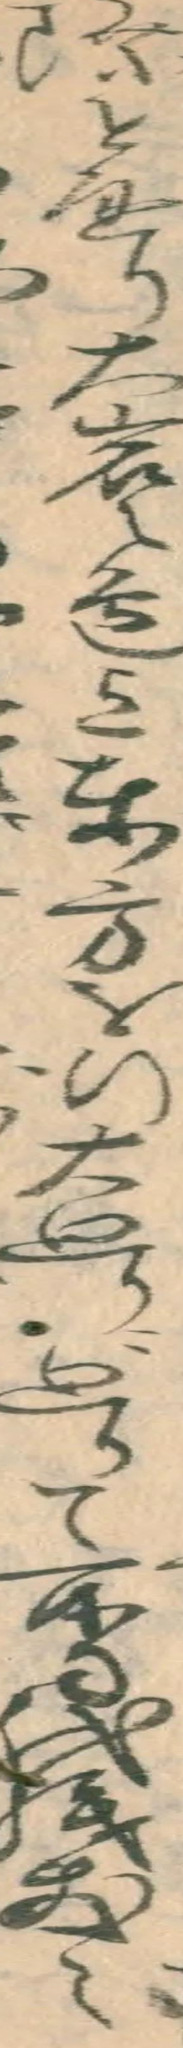際を通り大岩之辺迄東方を行大廻りニ廻りて所司代桟敷之
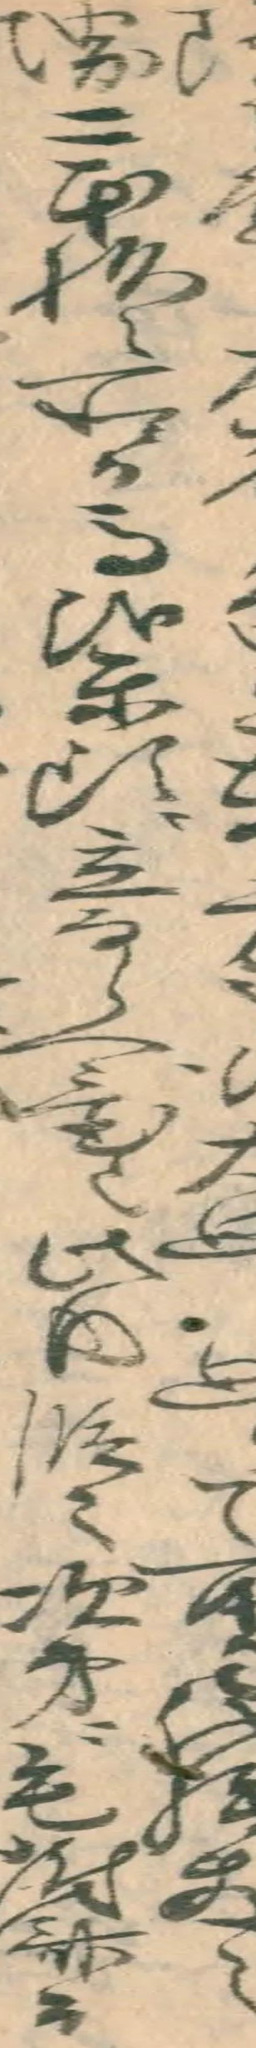堺二本杉之所ニ而馬を東頭ニ立ならへ置也此内段々次第ニ毛付済而
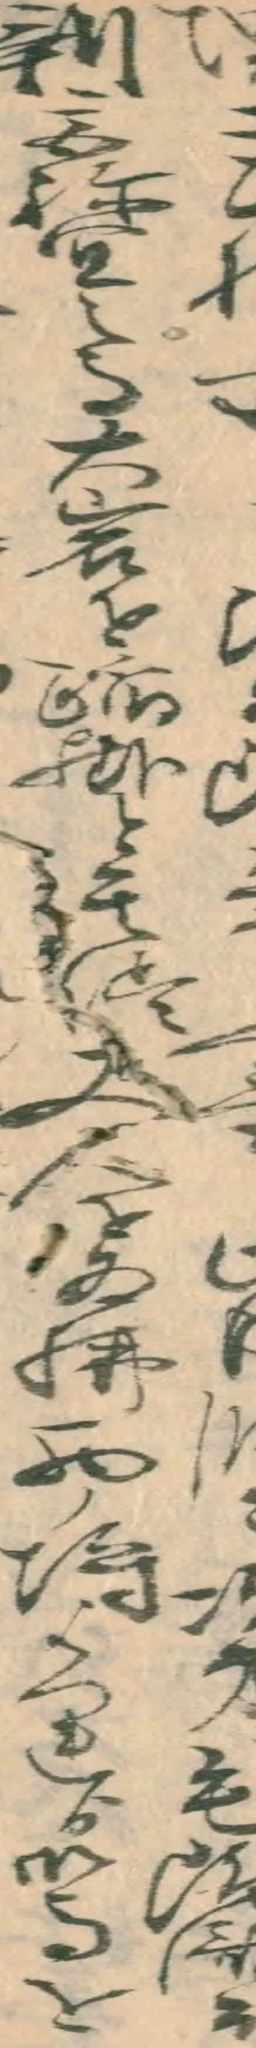新宮祢宜之馬大岩を踏掛と其侭又人を為払西ノ埒はつれゟ御馬を
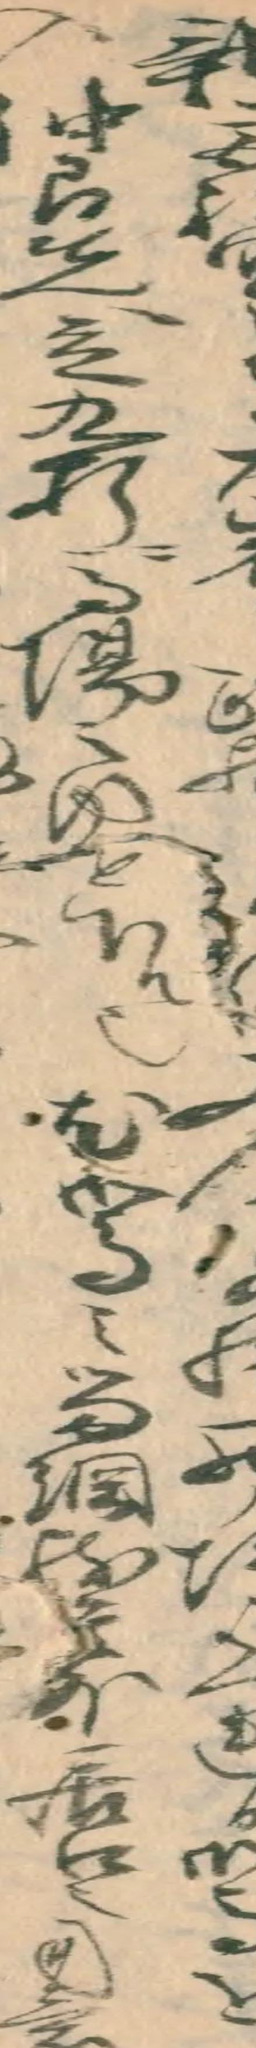入仲間先へ立九折ニ馬場之内を下ル也尤御馬之留綱持其外居口之用意
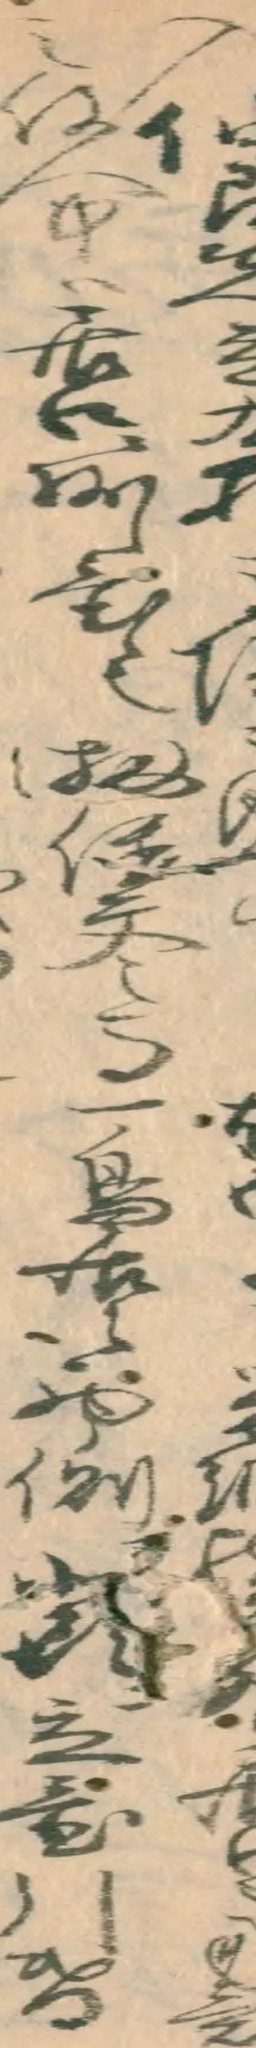之役人中ハ居口ニ置候也扨倭文之馬一ノ鳥居之西側ニ北頭ニ立置引替
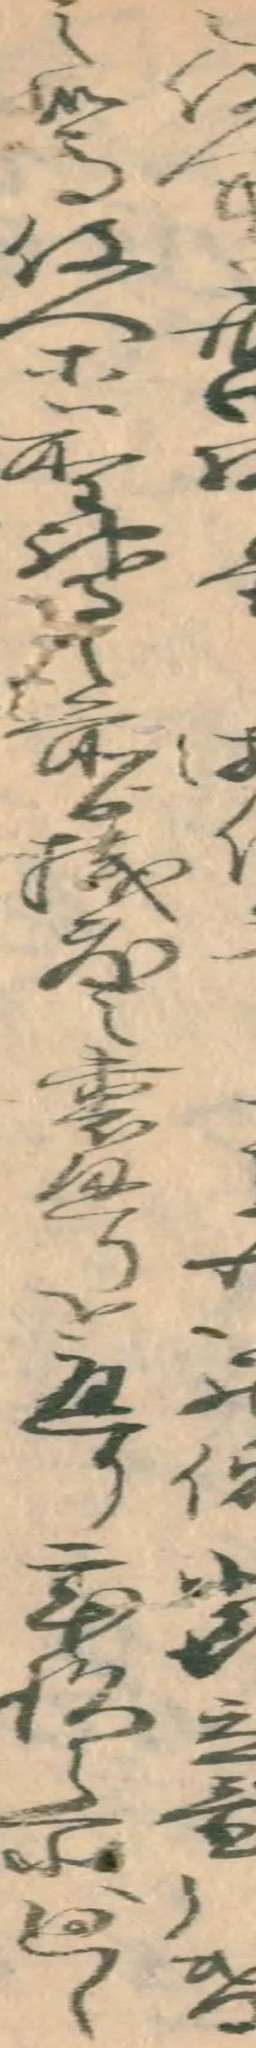之御馬役人等ハ聖神寺之前ゟ桟敷之裏通りを通り二本杉之所へ廻し
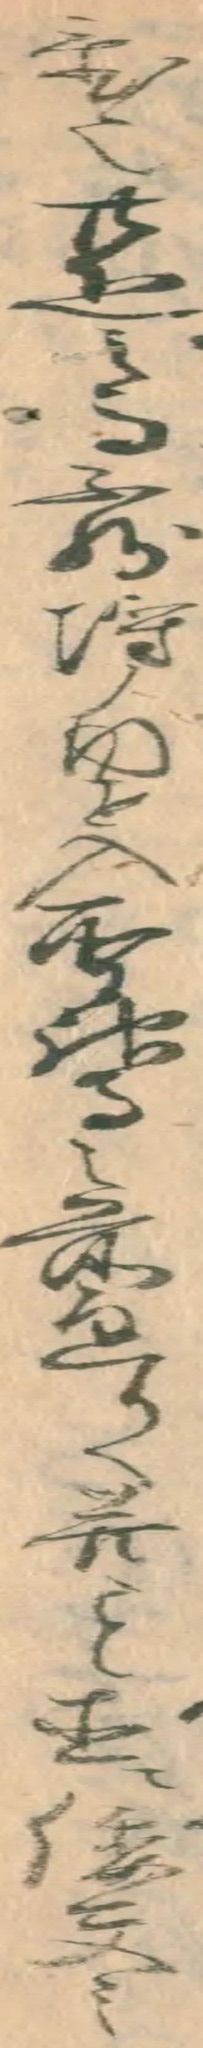置也廿疋之馬不残埒ノ内を入聖神寺之前通りへ并候て直ニ倭文之
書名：賀茂社記録. 第58冊
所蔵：国立国会図書館 National Diet Library, JAPAN
